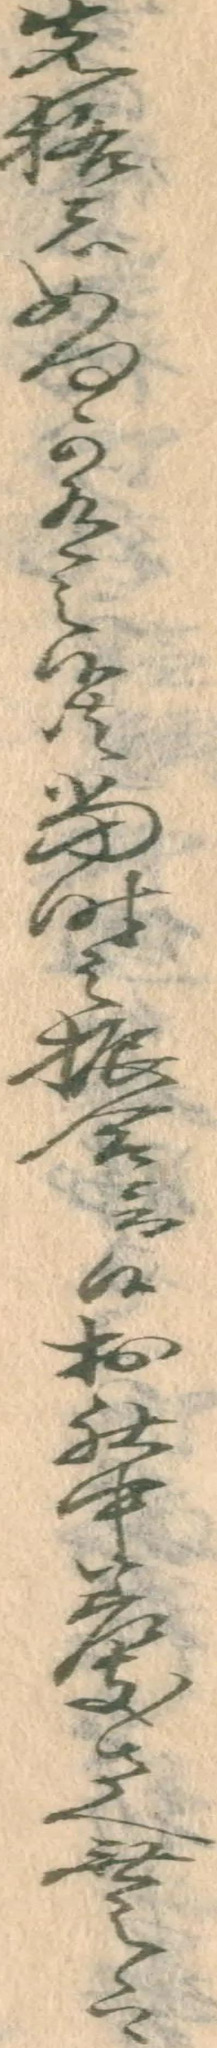先格は如何可有之候共当時之振合ニ而候於社中差支さへ無之候ハヽ
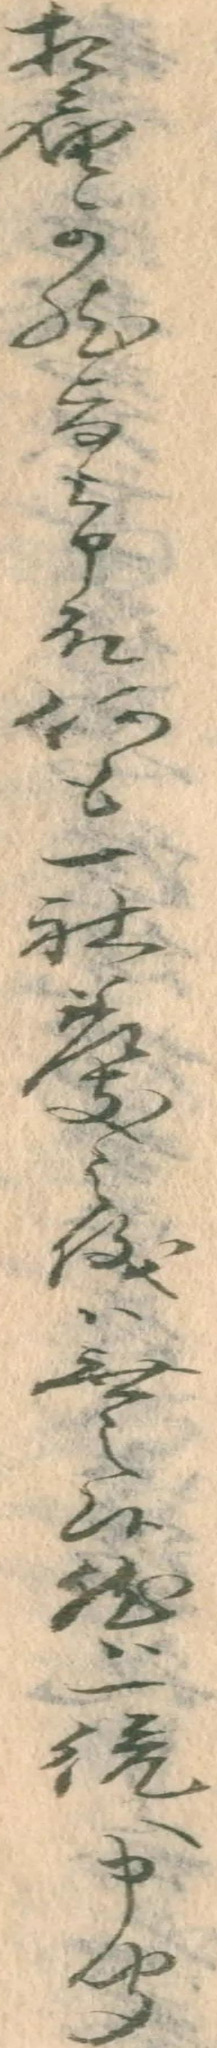相届可然旨被申故何も一社差支之儀ハ無之候然ハ一統へ申聞
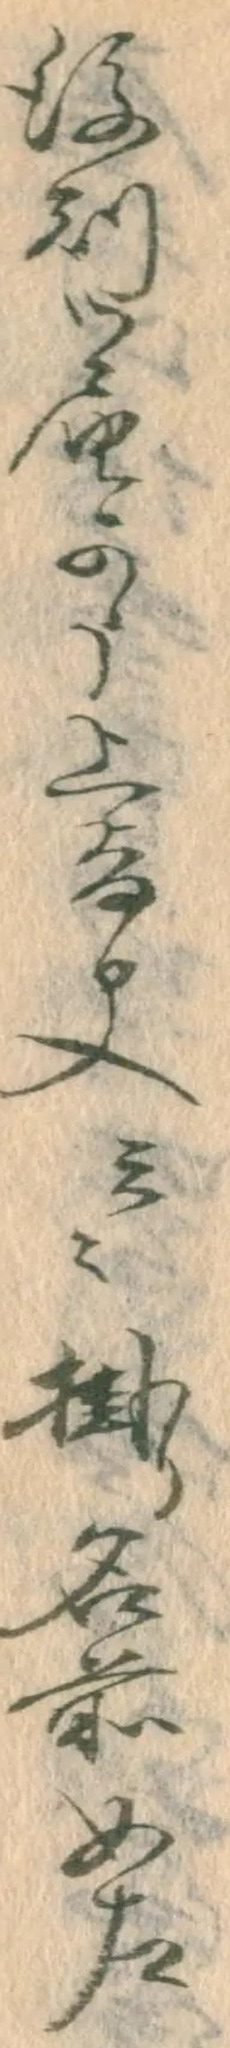後刻御届可申上旨申入云々掛り名前如左
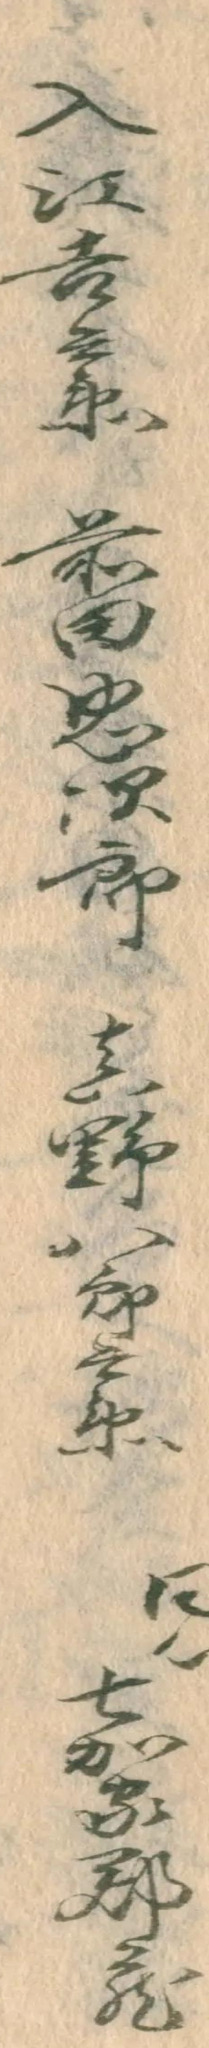入江吉兵衛前田忠次郎真野八郎兵衛嘉家郡蔵
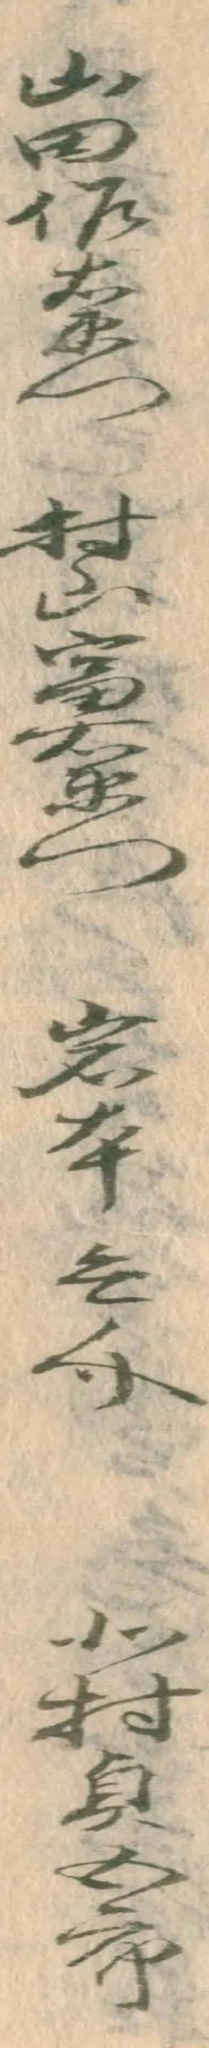山田作右衛門村山富右衛門岩本兵介北村貞五郎
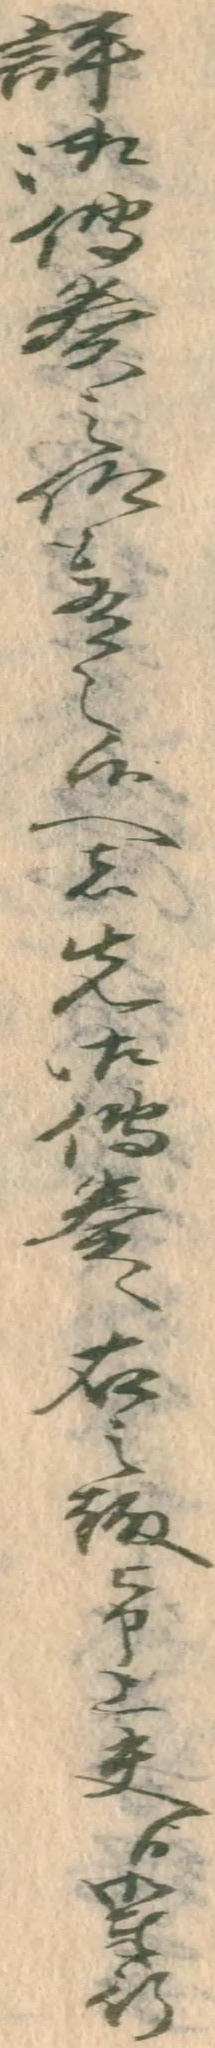評御伝奏之儀も有之候へは先御伝授へ右之趣被申上夫ゟ御奉行
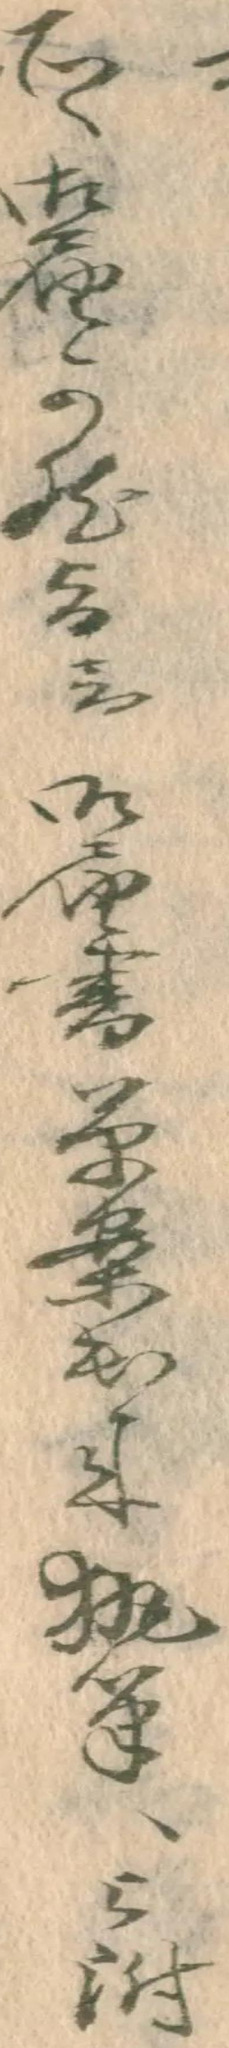所へ御届可然旨ニ而御届書草案出来執筆へ被附
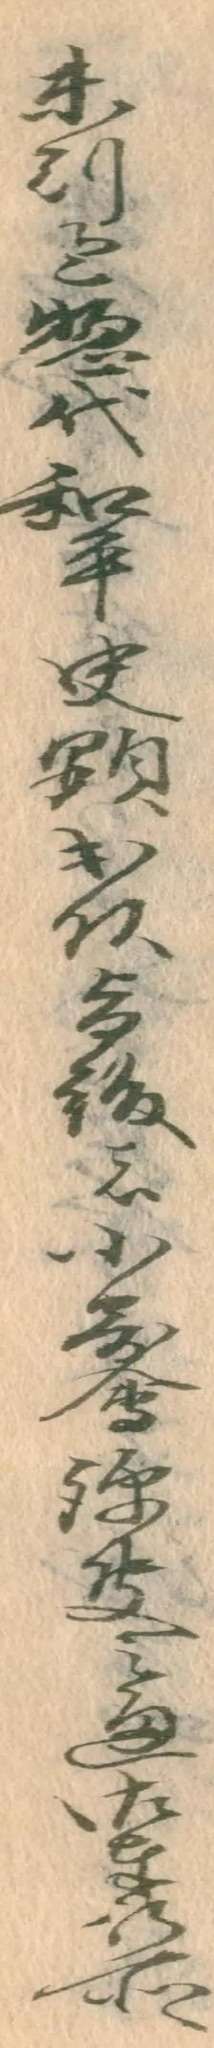一未刻過惣代和平史顕出頭旨趣は小寄会弥決之通御奉行所へ
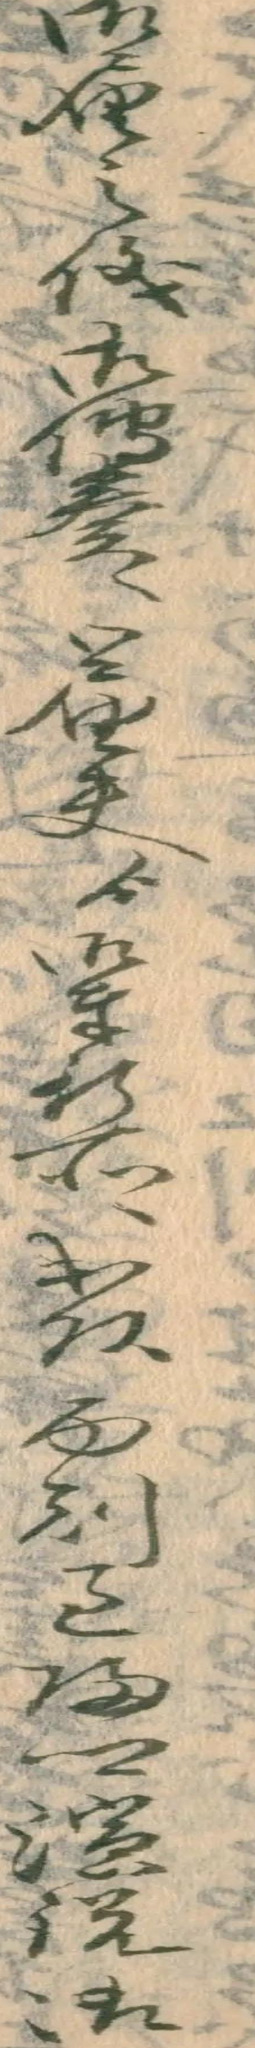御届之儀御伝奏へ御届夫ゟ御奉行所へ出頭酉刻過帰郷演説御
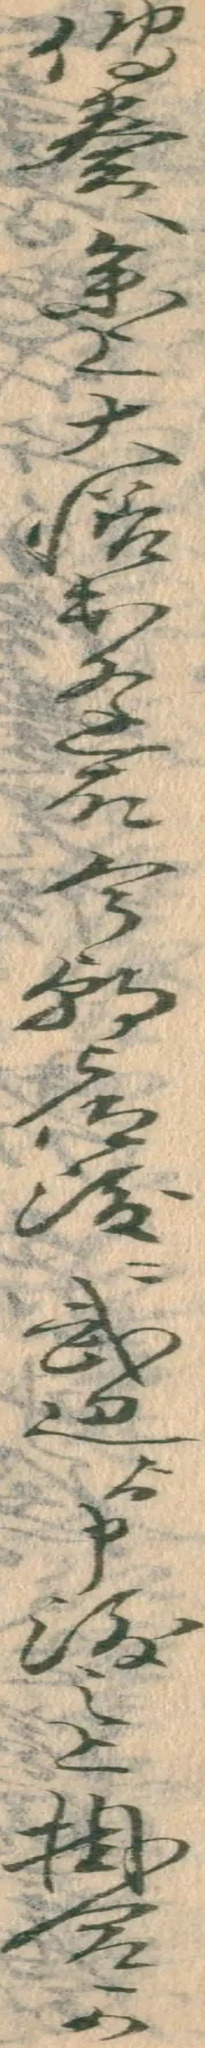伝奏へ参上大膳出逢故今朝被仰渡ニ武辺ゟ申渡之上掛合可
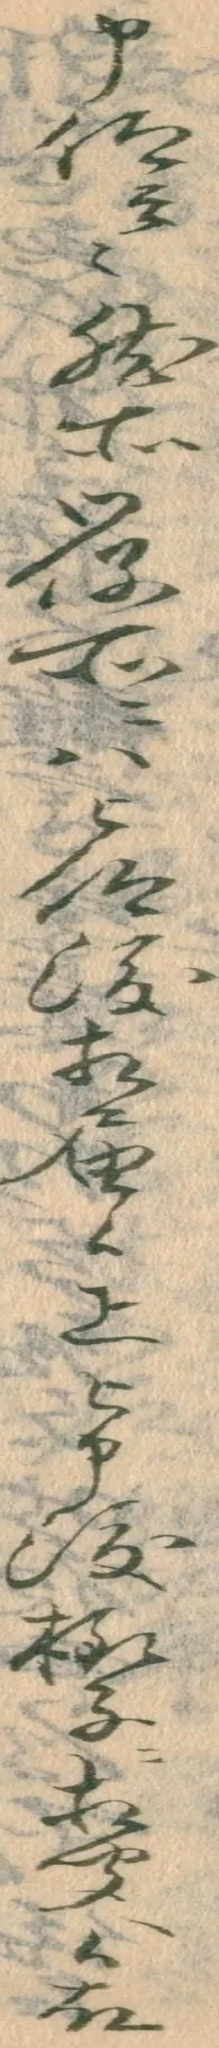申仰云々然所御役所ニハ被仰渡相届候上被申渡様子ニ相聞候故
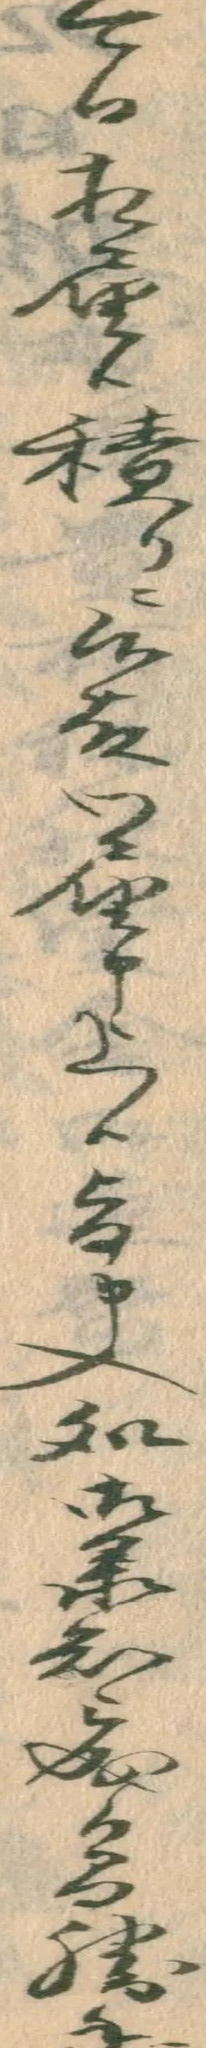今日相届候積りニ候故御届申上候旨申入処御承知被成候間勝手ニ
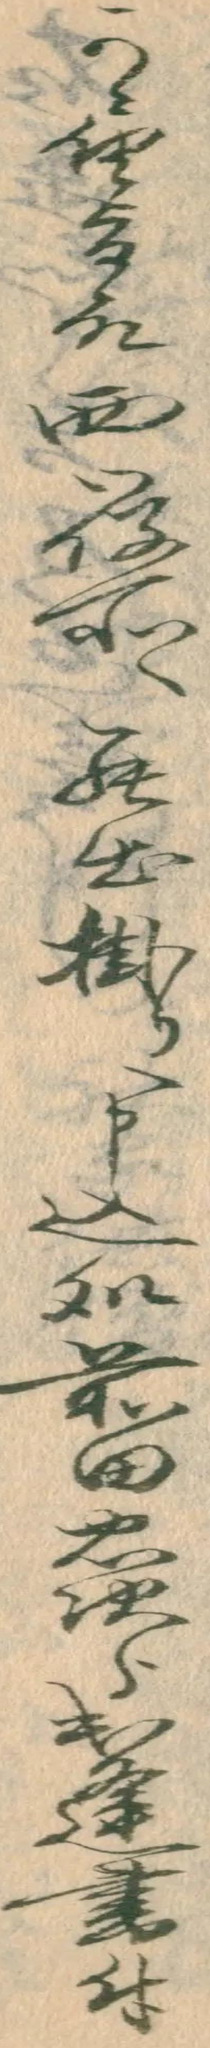可届旨故西御役所へ罷出掛りへ申込処前田忠次郎出逢書付
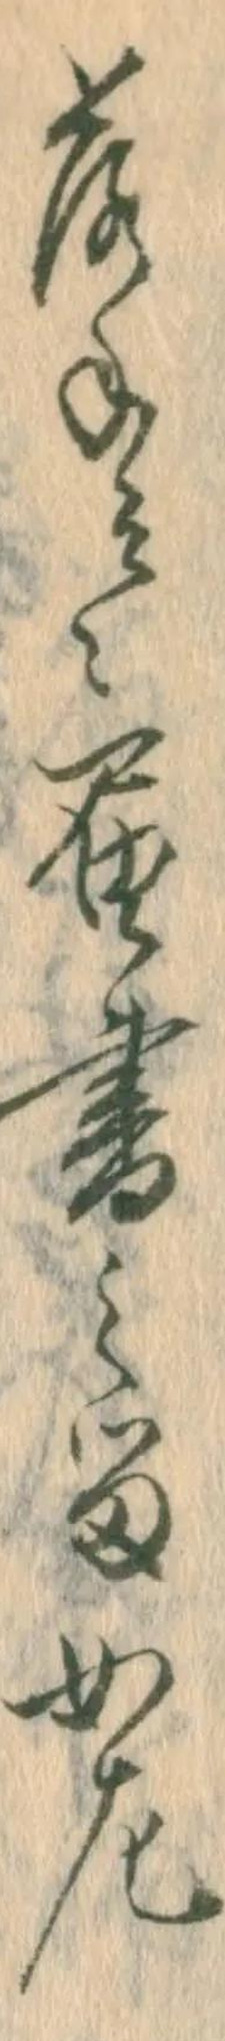落手云々届書之留如左
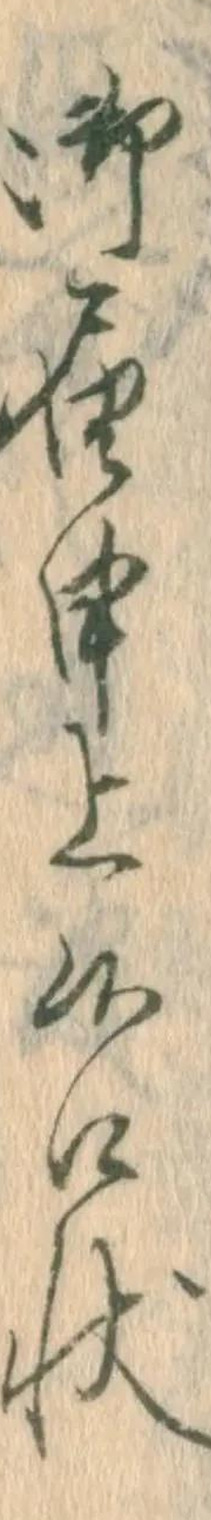御届申上候口状
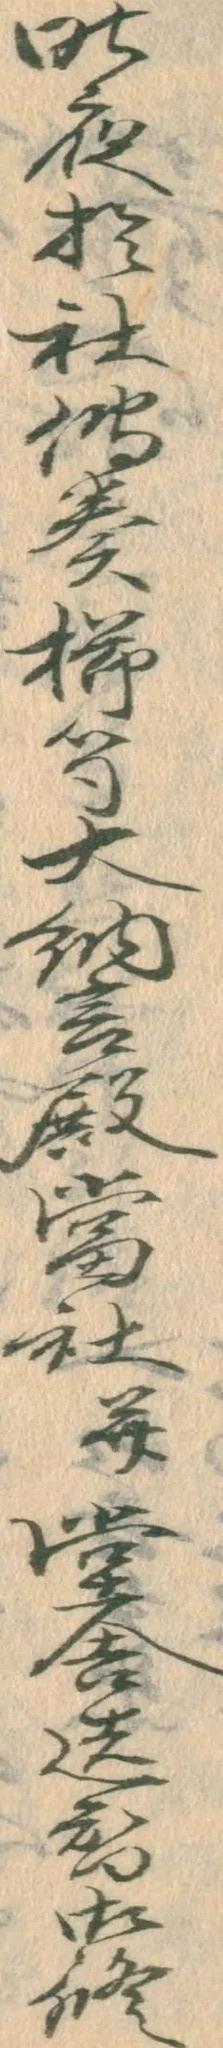昨夜於社伝奏櫛笥大納言殿当社并堂舎造替御修
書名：賀茂社記録. 第17冊
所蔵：国立国会図書館 National Diet Library, JAPAN
